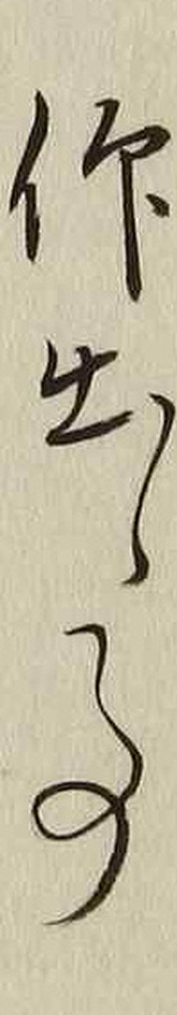仰渡候事
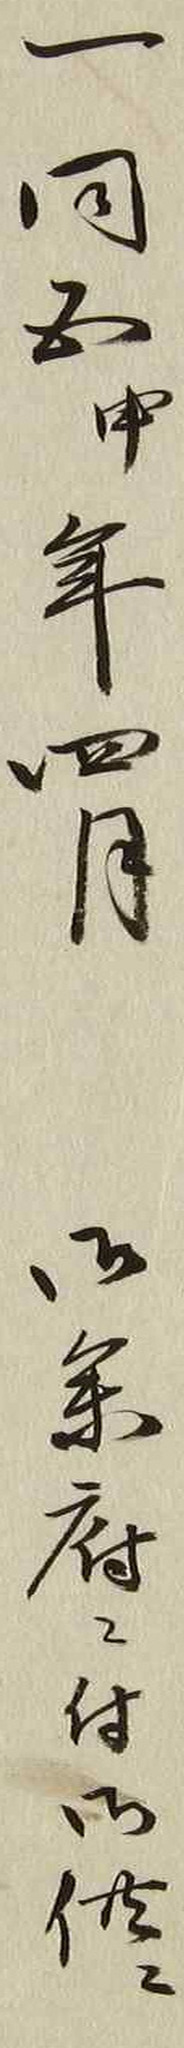一同五申年四月御参府ニ付御供ニ
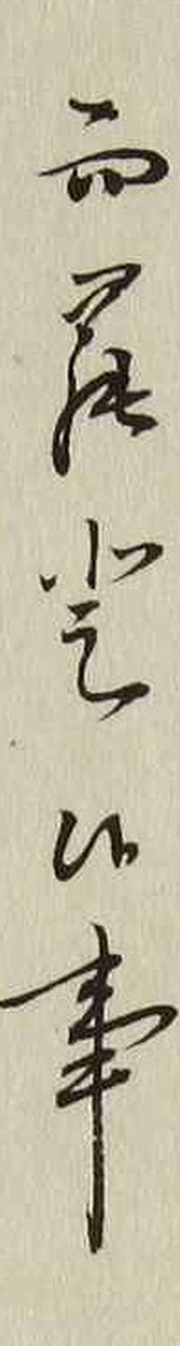而罷登候事
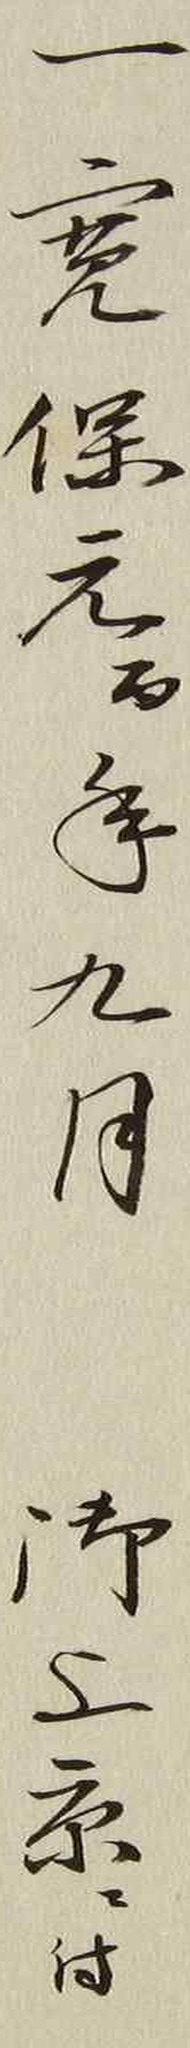一寛保元酉年九月御上京ニ付
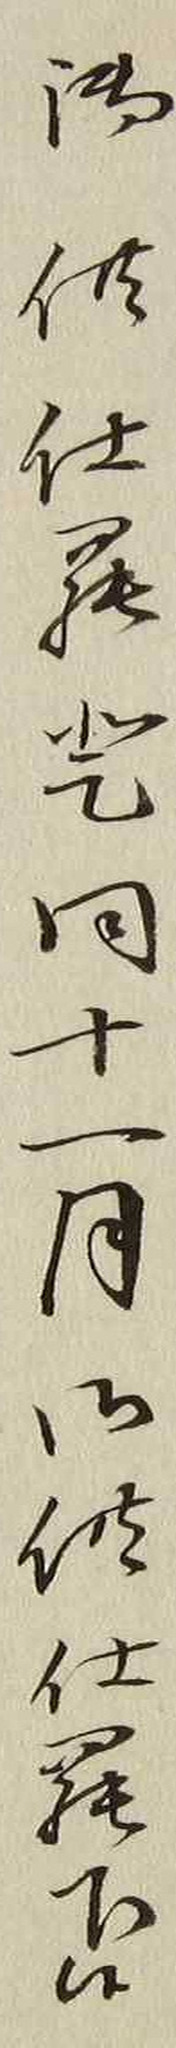御供仕罷登同十一月御供仕罷下候
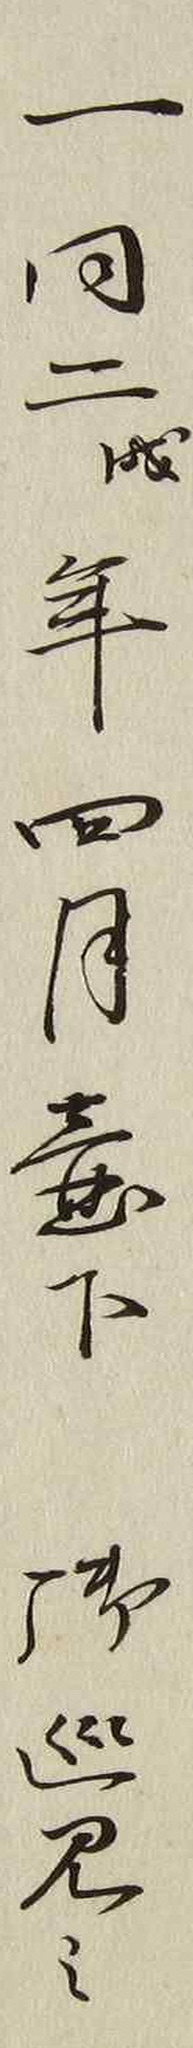一同二戌年四月壺下御巡見之
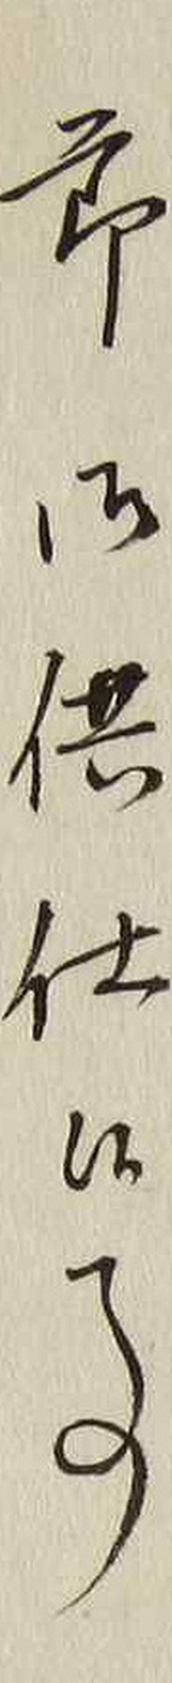節御供仕候事
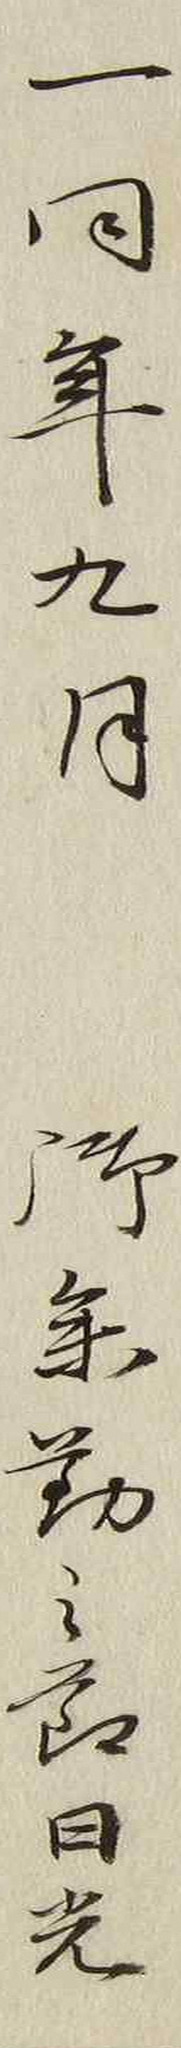一同年九月御参勤之節日光
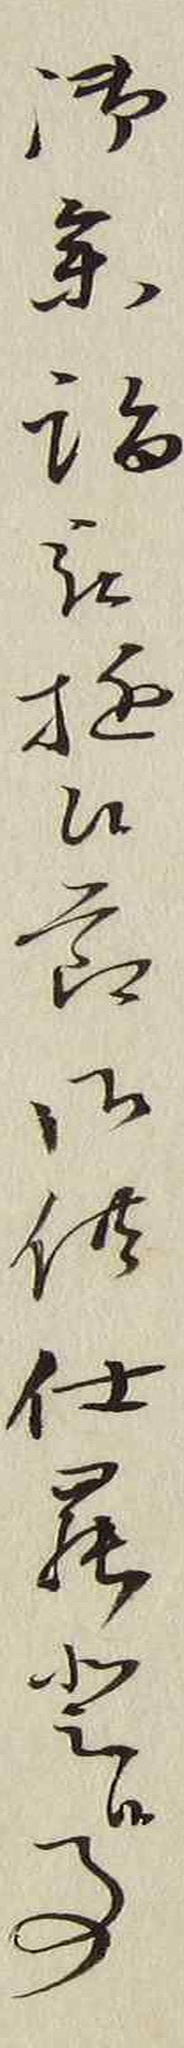御参詣被遊候節御供仕罷登候事
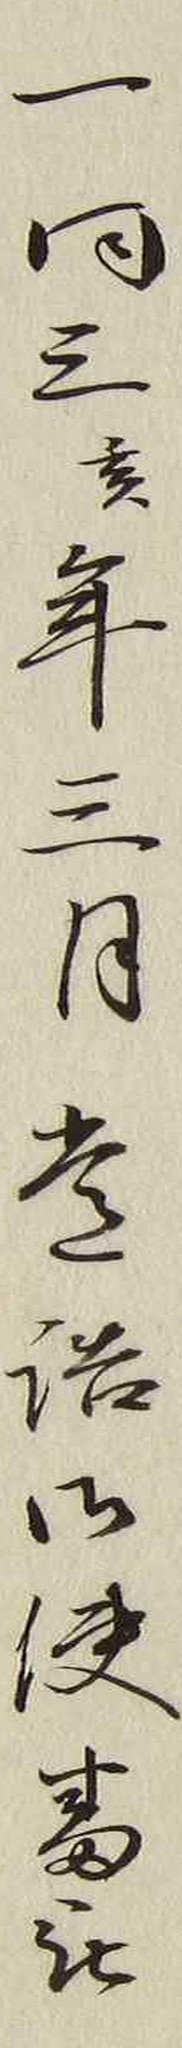一同三亥年三月常詰御使番被
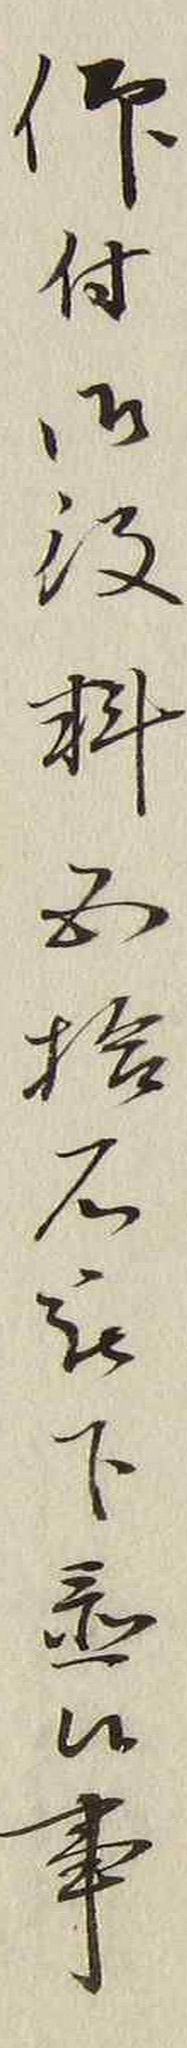仰付御役料五拾石被下置候事

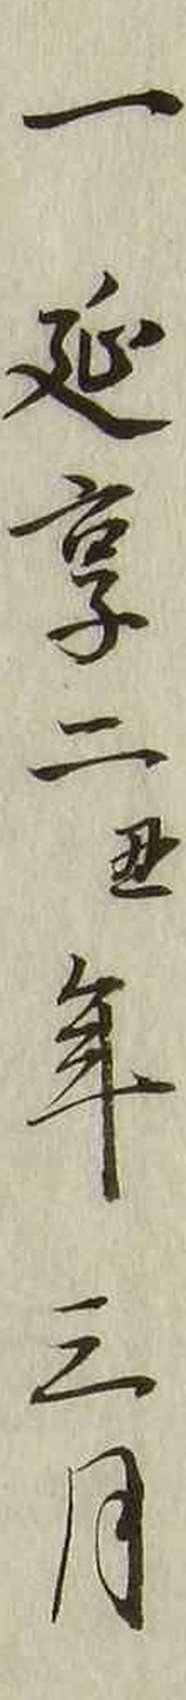一延享二丑年三月
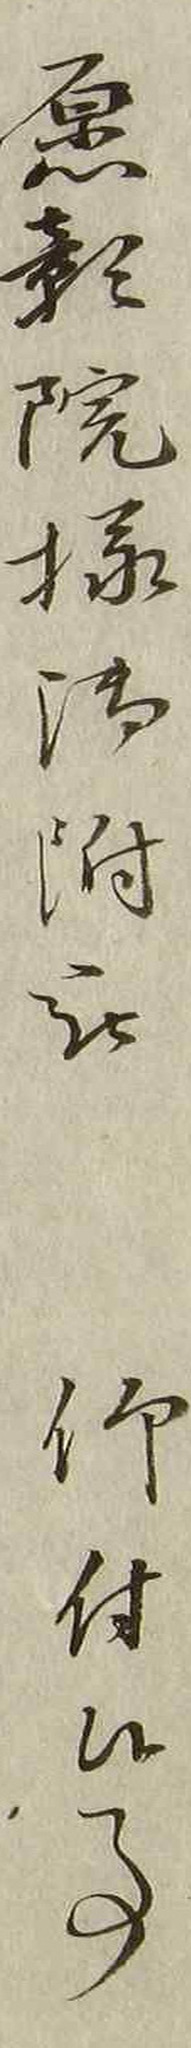愿彰院様御附被仰付候事
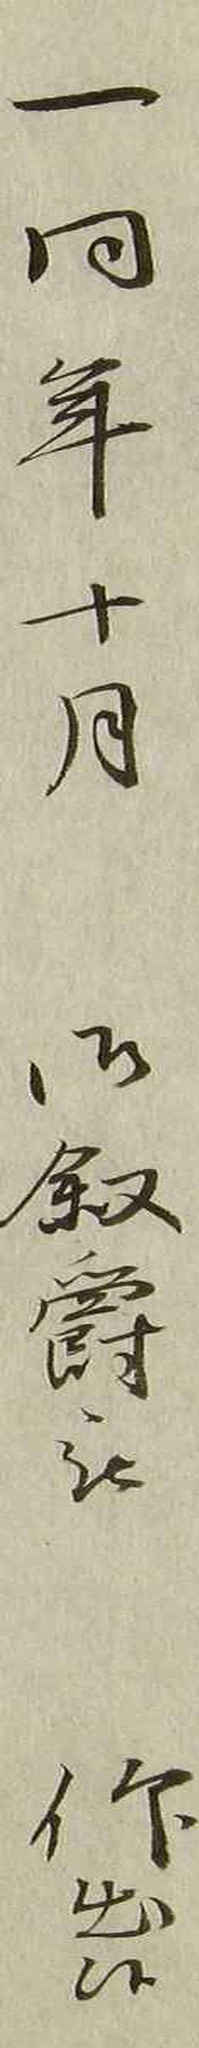一同年十月御叙爵被仰出候
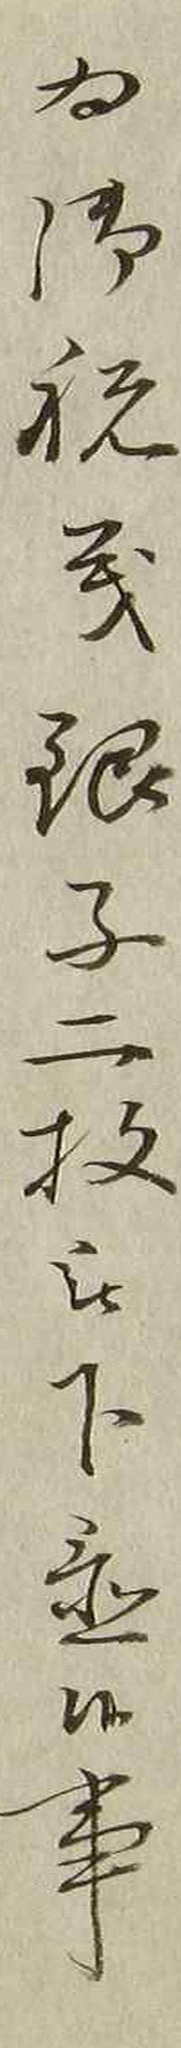為御祝儀銀子二枚被下置候事
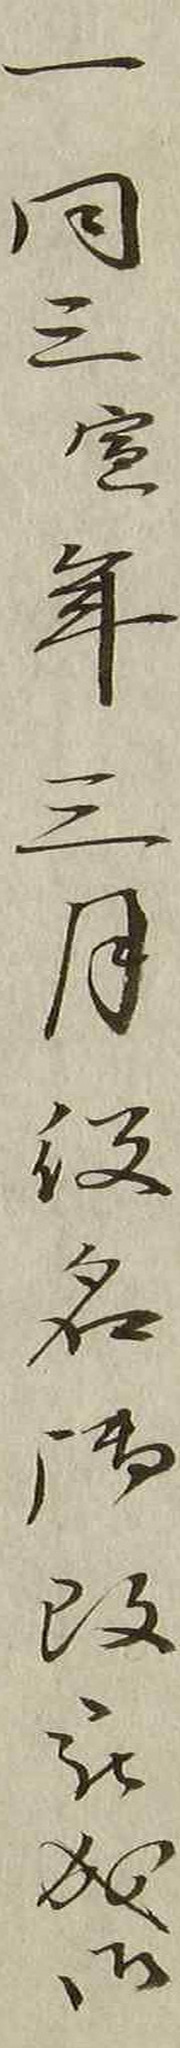一同三寅年三月役名御改被成御
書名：諸士系譜　巻之19　い之部19
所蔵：会津若松市立会津図書館
